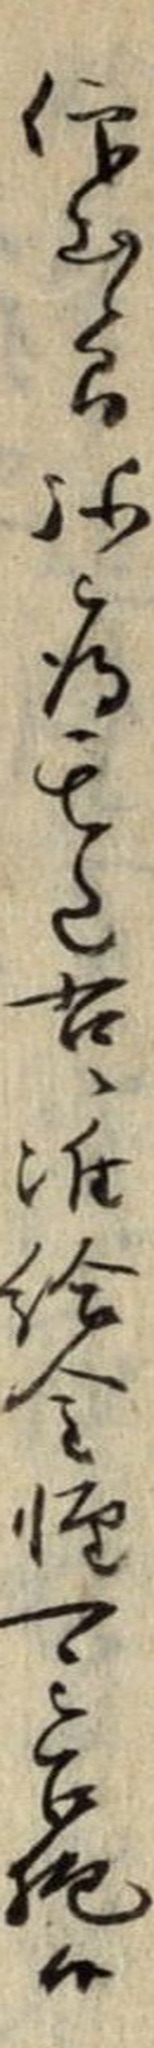仰出候間弥被得其意右へ准給金軽可被召抱候
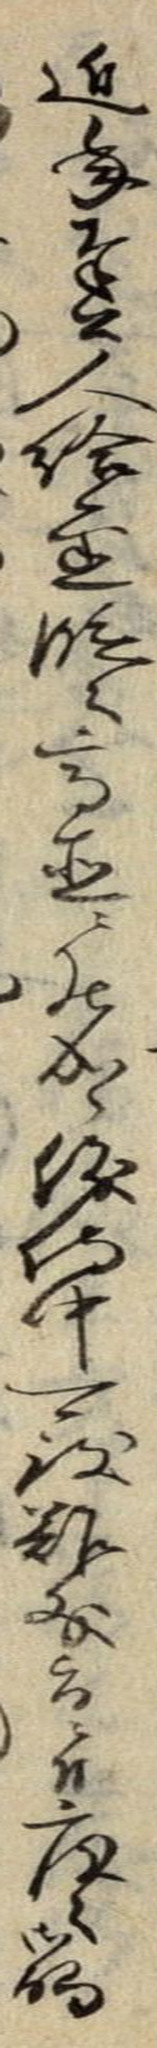一近年奉公人給金段々高直に罷成候儀侍中可致難義旨に付度々御触
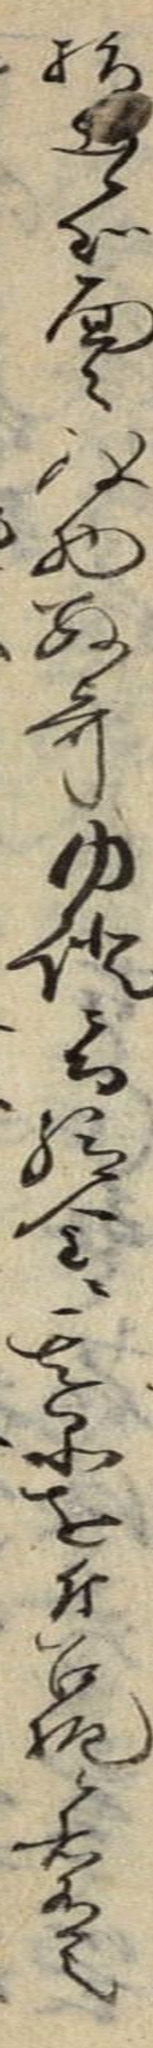指出候処面々致物数奇内證にて給金に其品を付召抱候者有之
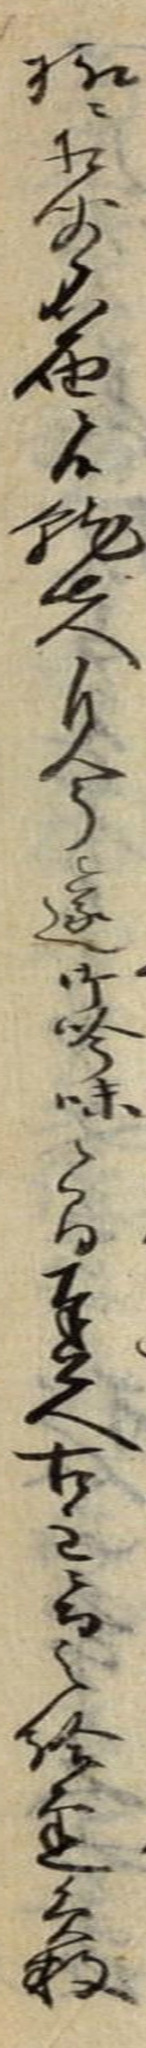様に相聞不届に候就夫自今遂御吟味候間奉公人古主にて之給金員数
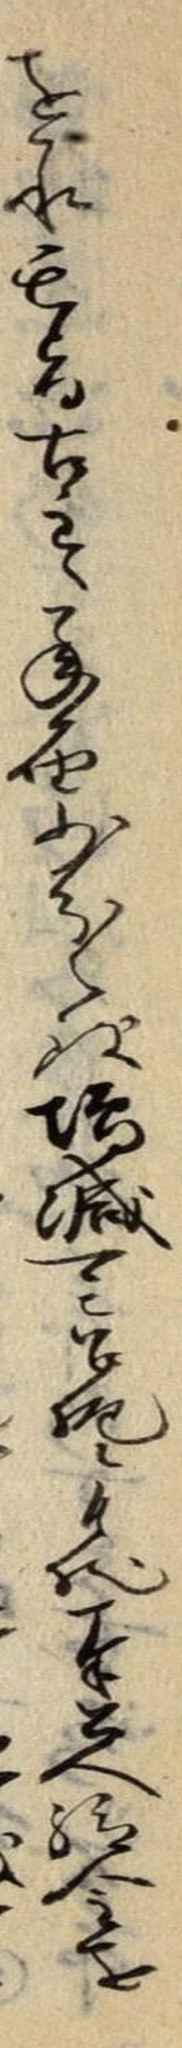を承其旨古主へ承届少分之致増減可被召抱候自然奉公人給金を
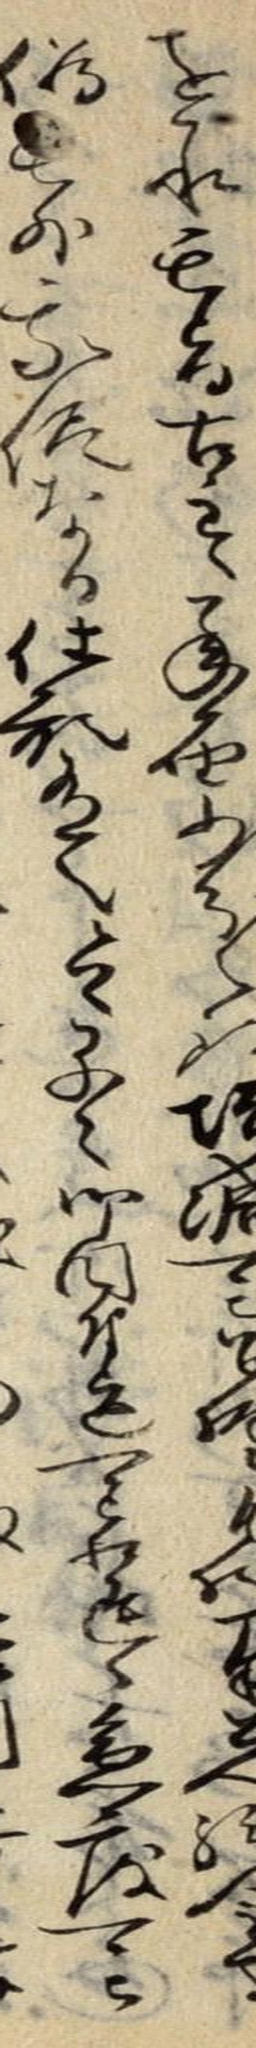偽其外我儘なる仕形有之候はゝ早々御目付迄可被相達候急度可被
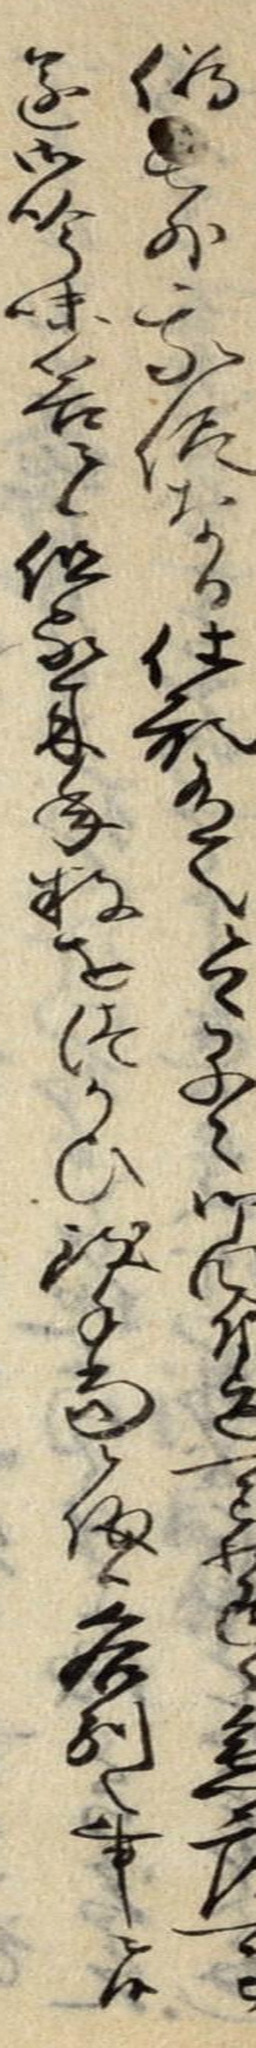遂御吟味筈に候但家来年数をつかひ致手当候儀は格別之事に候
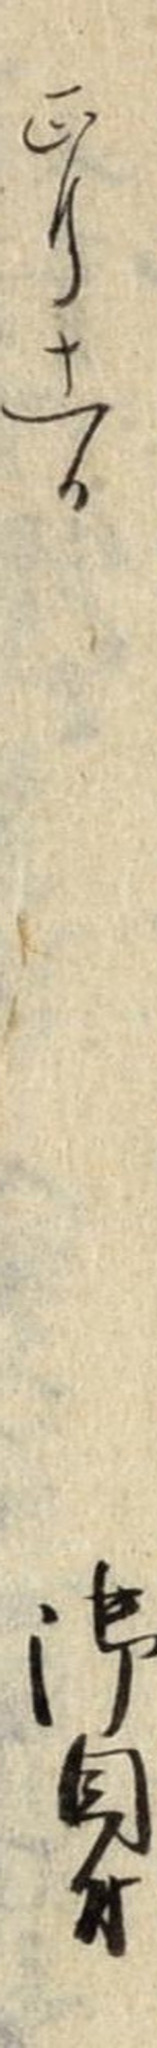正月十一日御目付
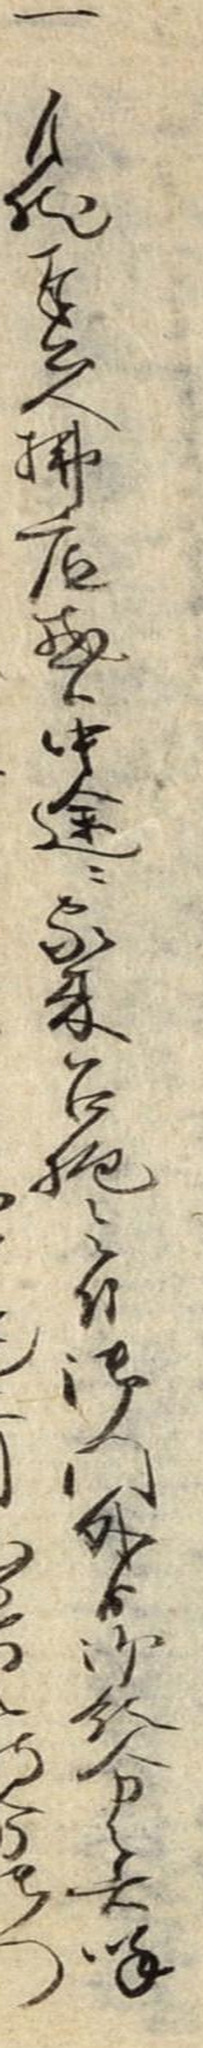一自然奉公人払底或は中途に家来召抱候に付御門外ゟ御領分之者呼
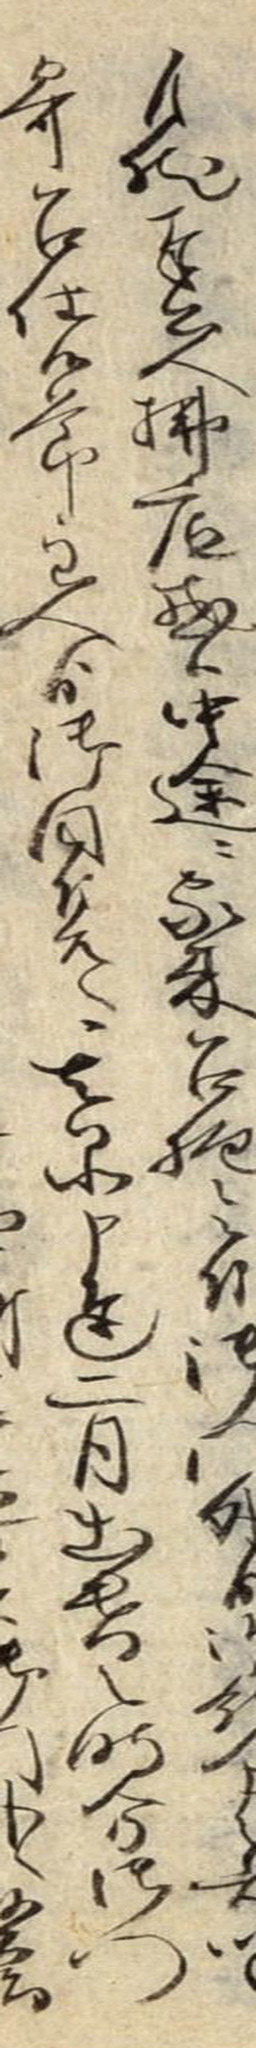寄召仕候節主人ゟ御目付共へ其品申達二月出替之時分御門
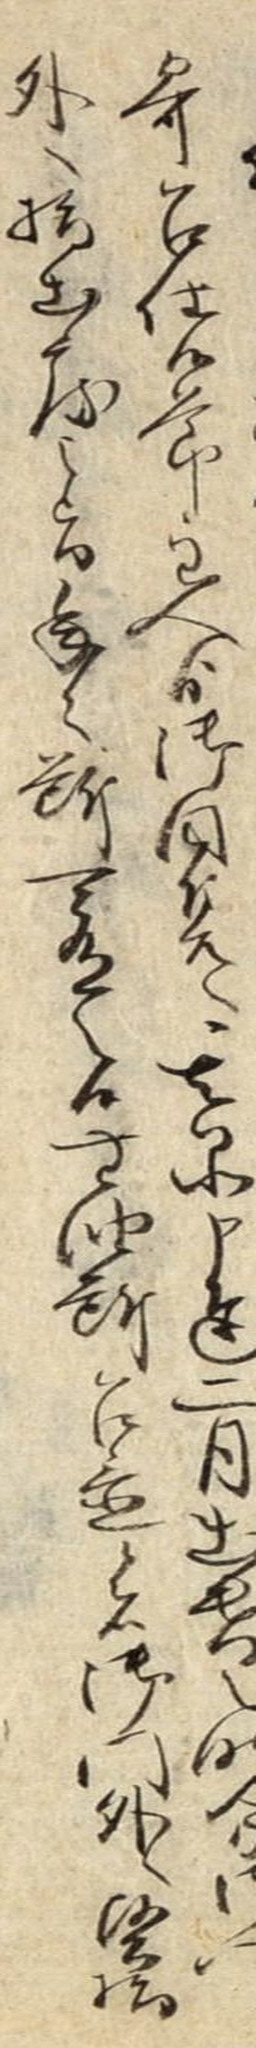外へ指出度之旨年々断可有之候無油断召置候者御門外へ堅指
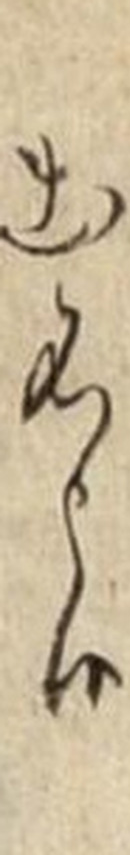出不申候
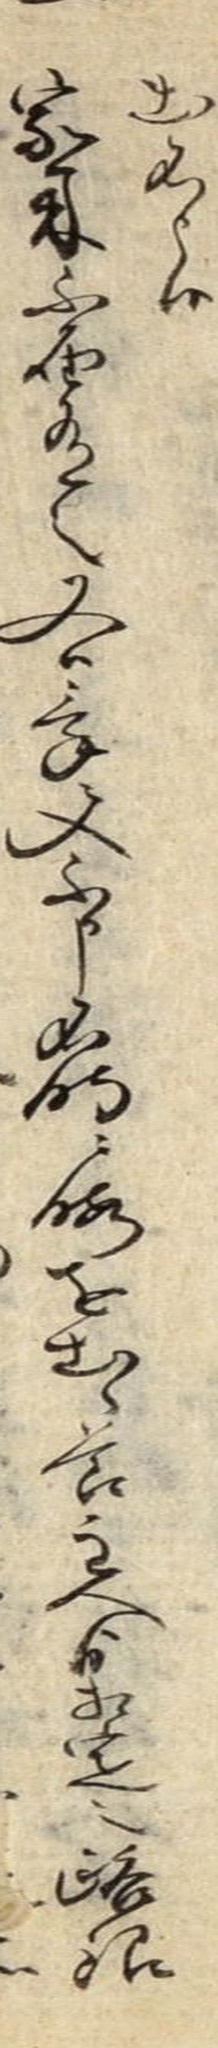一家来不届有之又は気に入不申不時に暇を出候節主人ゟ相定之路銀
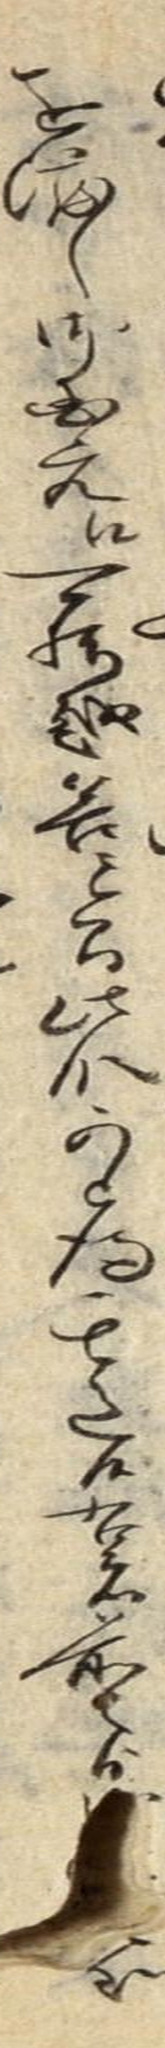を渡し御国元江可指越筈に候間此段可被得其意候右は前々ゟ処
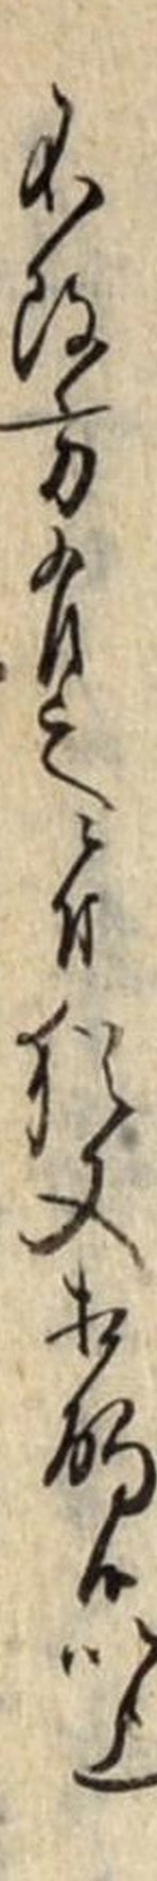不改方有之に付猶又相触候以上
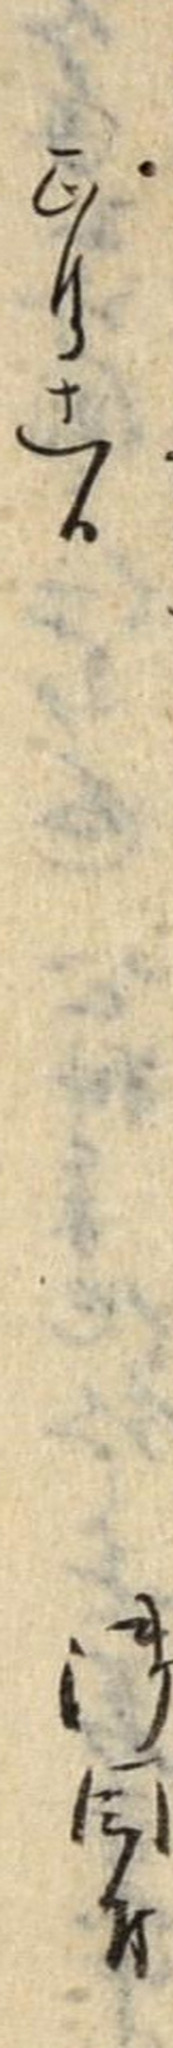正月十一日御目付
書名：三都并道中之部
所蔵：福井県文書館 Fukui Prefectural Archives
